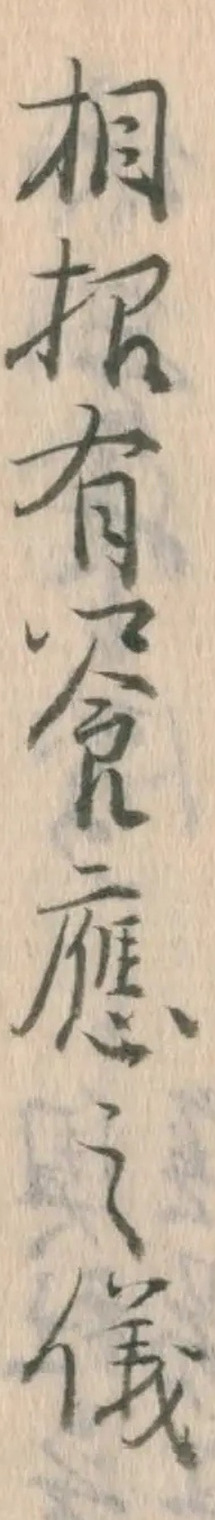相招有饗応之儀
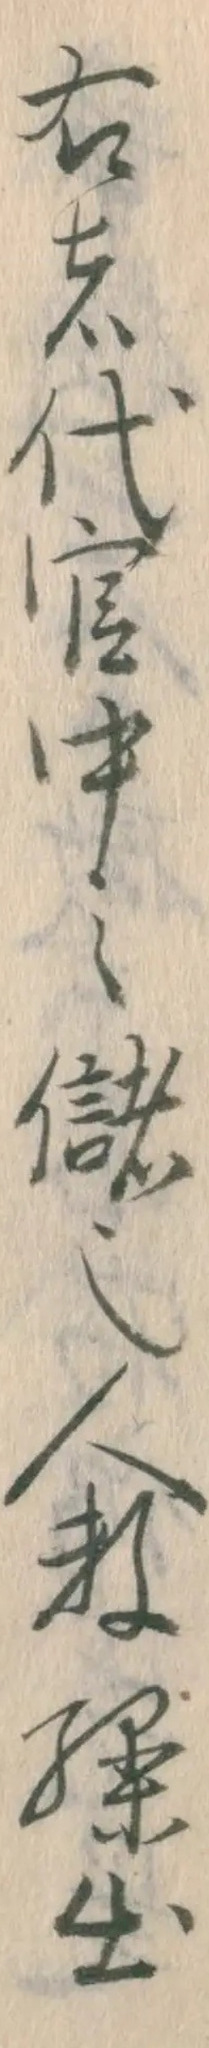右者代官中之儲也人数繰出
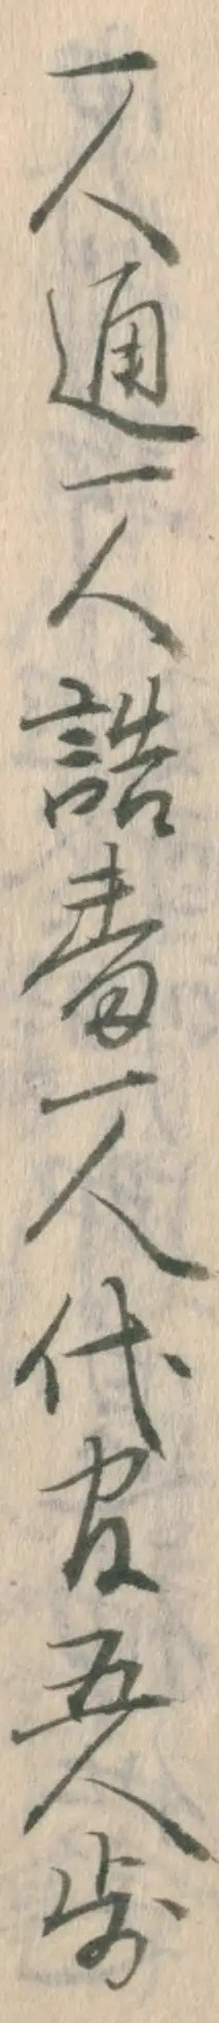一人通一人詰番一人代官五人歩

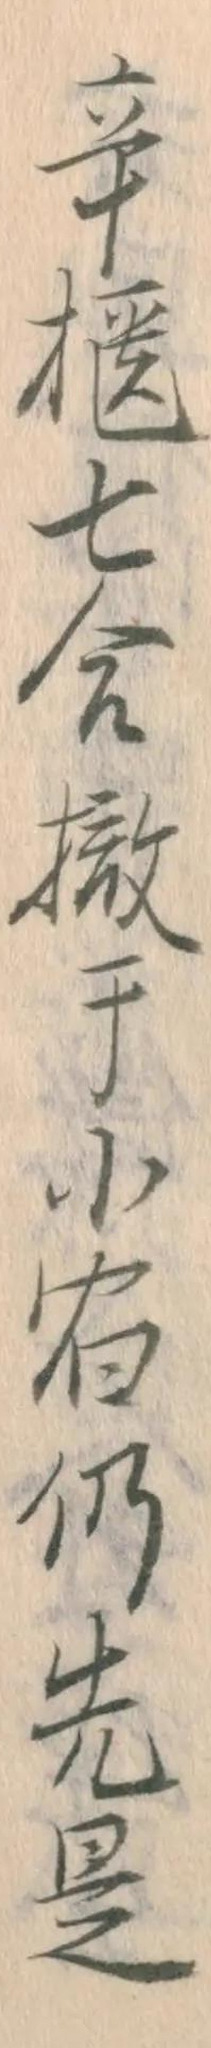辛櫃七合撤于小宿仍先是
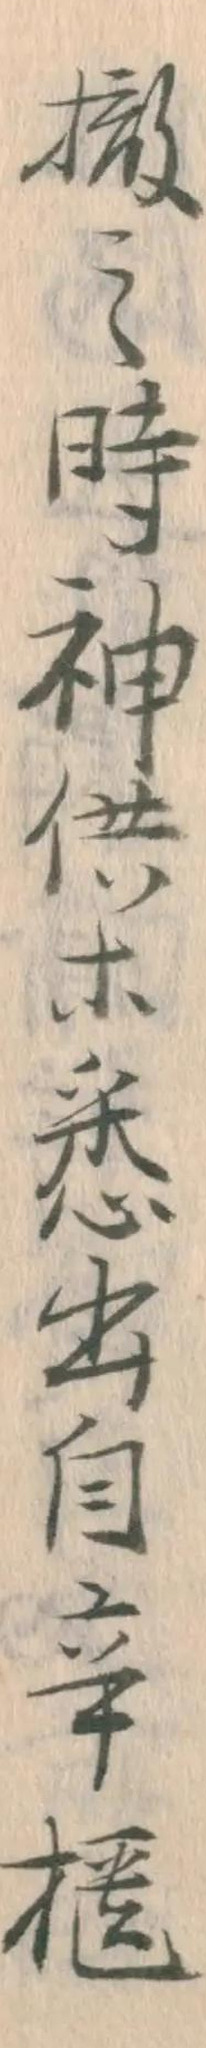撤之時神供等悉出自辛櫃
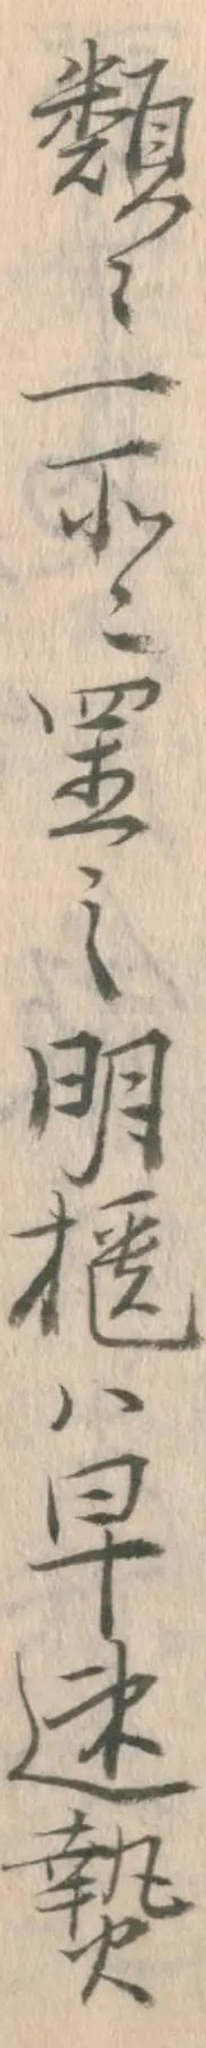類々一所に置之明櫃は早速熱
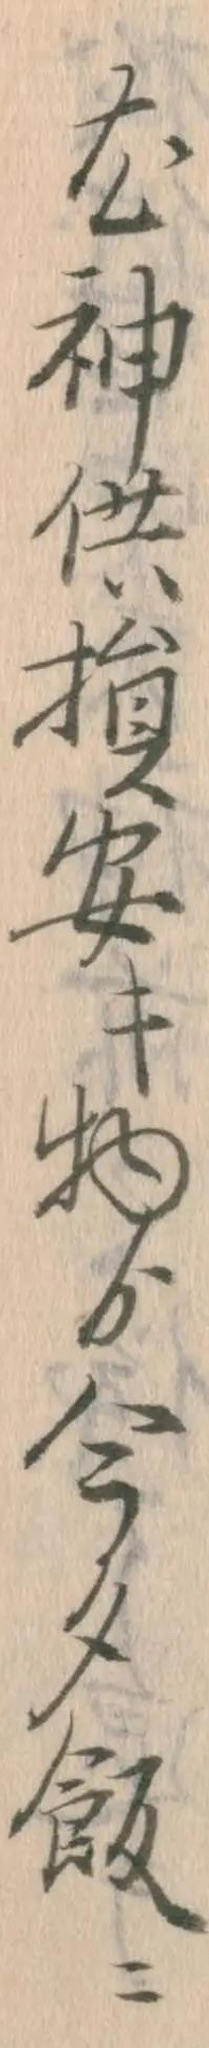尤神供損安き物ゟ今夕飯に
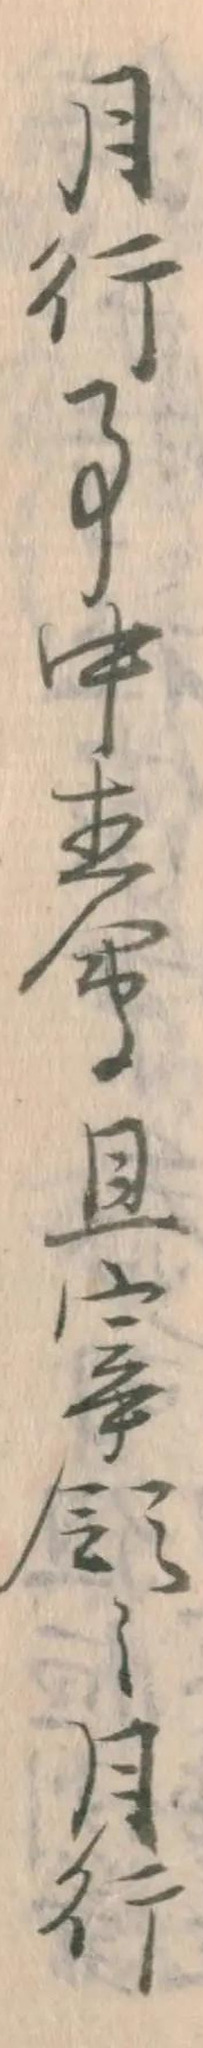月行事中直会且宰領之月行
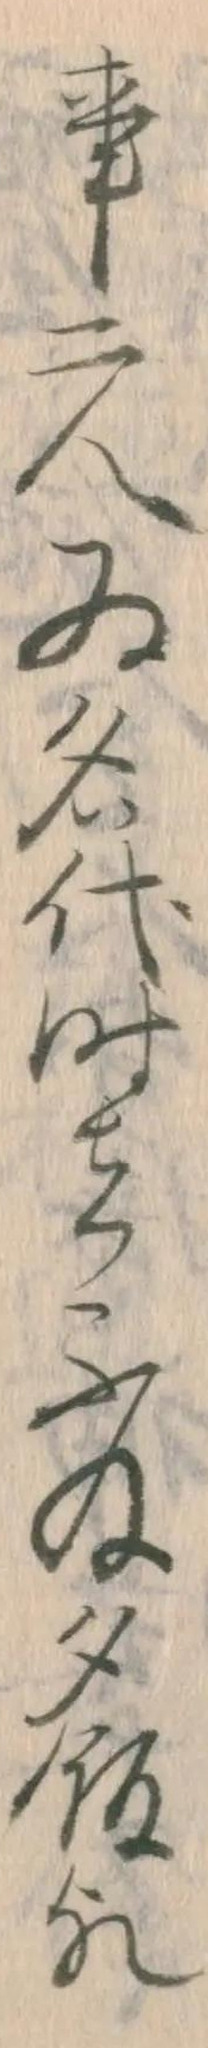事二人為名代時者不及夕飯歟
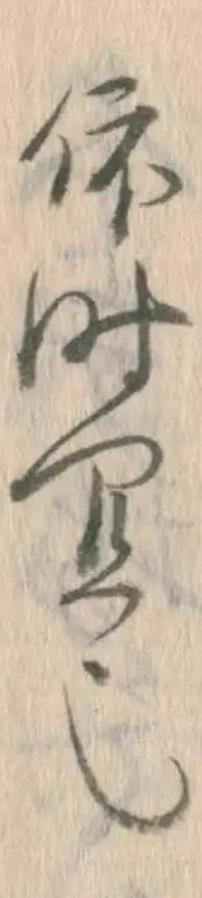依時宜也
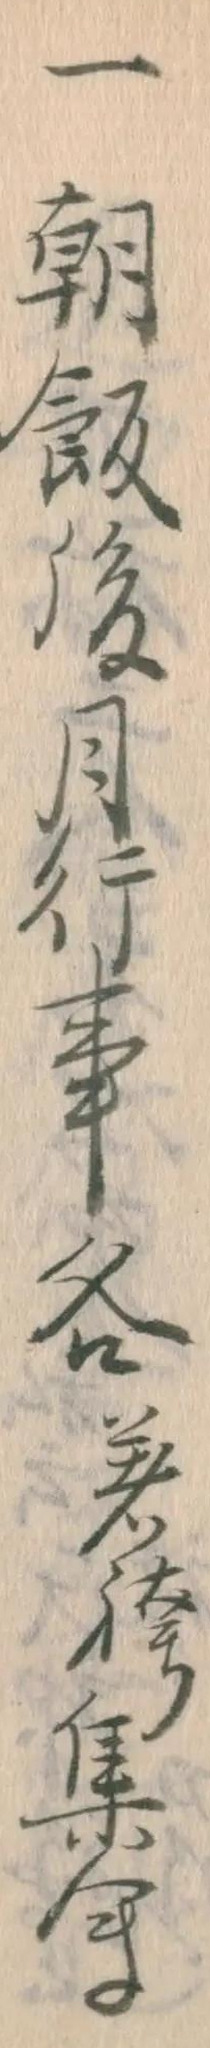一朝飯後月行事各着袴集会
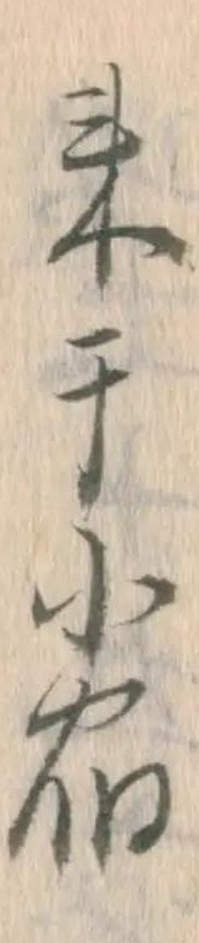来于小宿
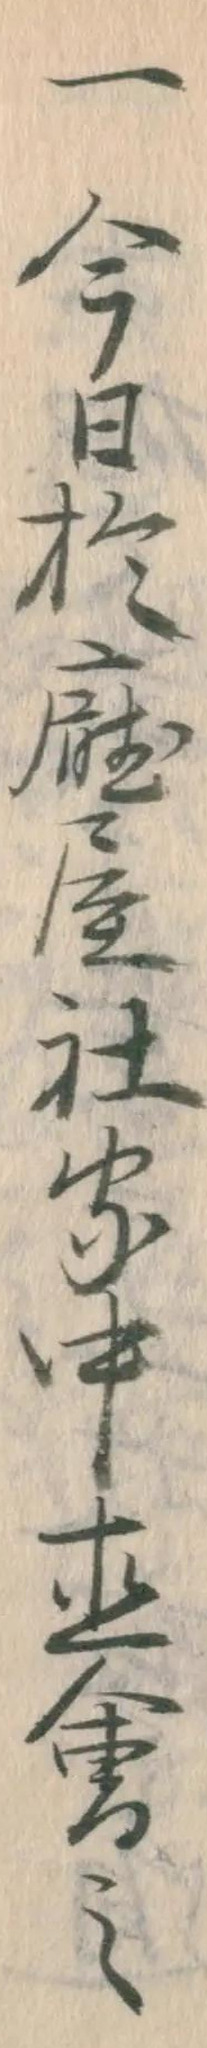一今日於庁屋社家中直会之
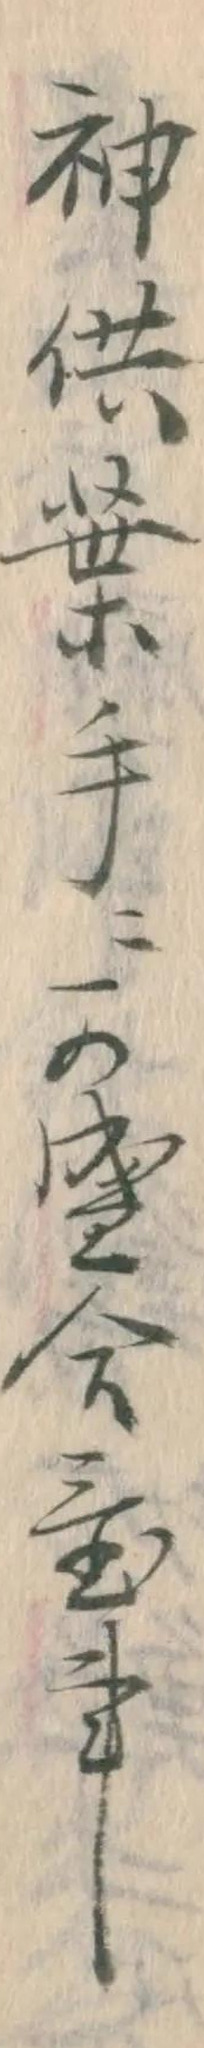神供葉手に可盛合置事

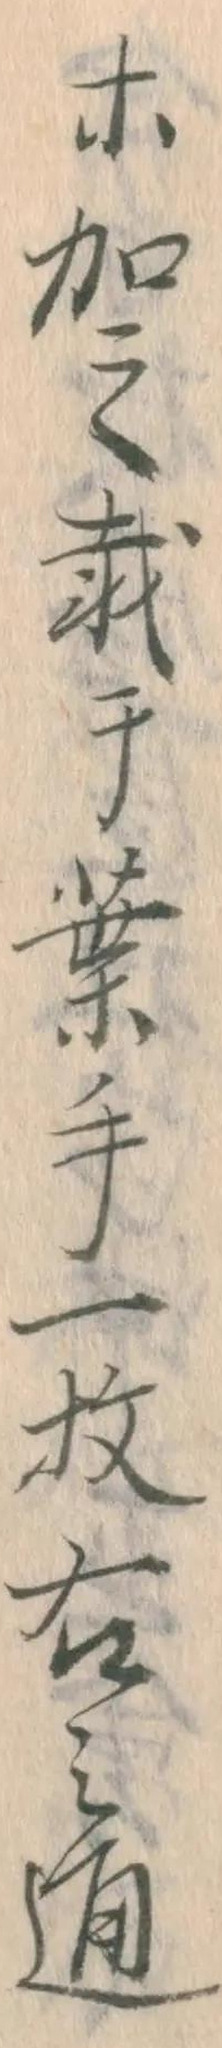等加之載于葉手一枚右之通
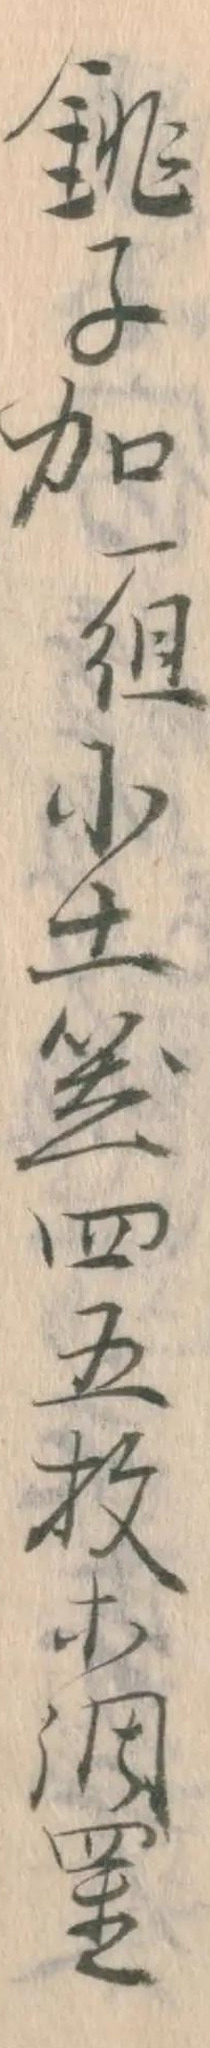銚子加一組小土器四五枚等調置
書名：賀茂社記録. 第81冊
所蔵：国立国会図書館 National Diet Library, JAPAN
